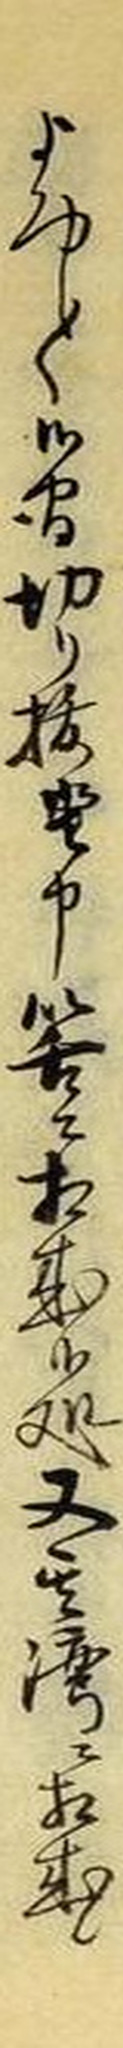よろしく候間切り抜き申筈ニ成候処又其湾に相成し
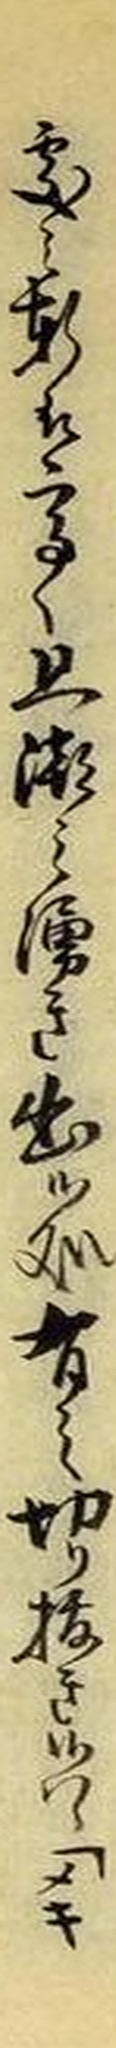處之斬取高く上瀬之沸き出候処有之切り抜き候ハゝ「メキ
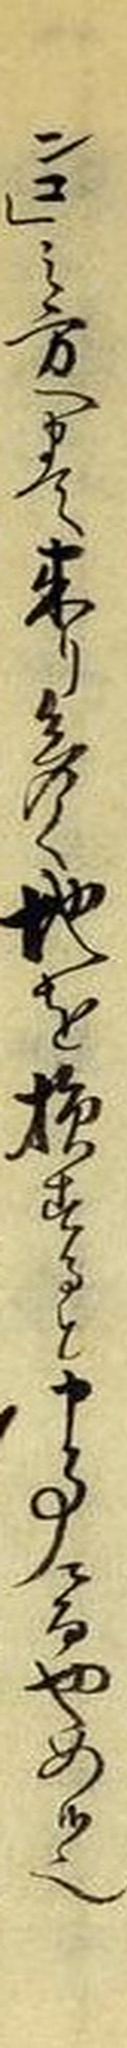ンコ」之方まて来り多く地を損すると申事ニ而やめ候也
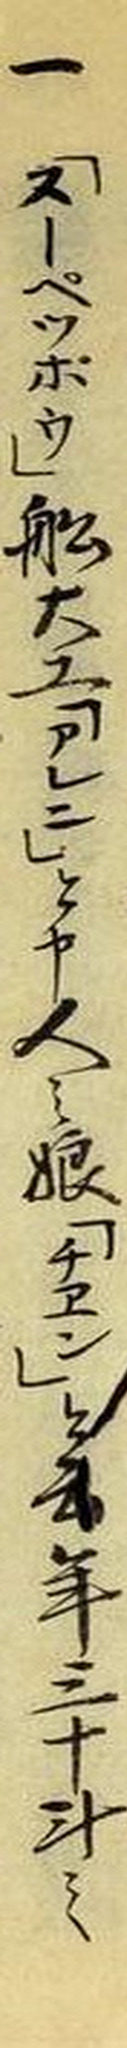一「ス❘ぺツホウ」船大工「アレニ」と申人之娘「チエン」と云年三十計之
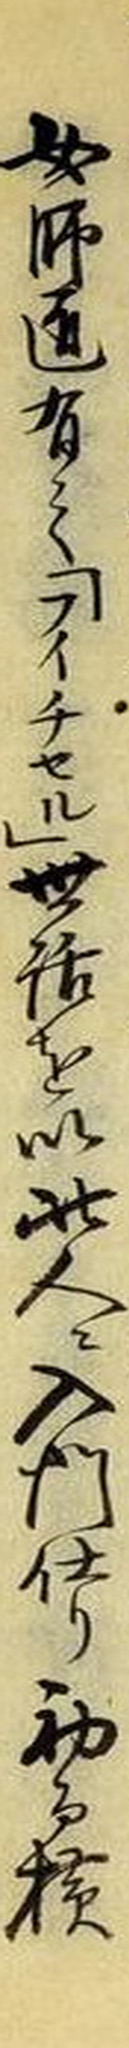女師道有之「フイチセル」世話を以此人にニ入門仕り初而横
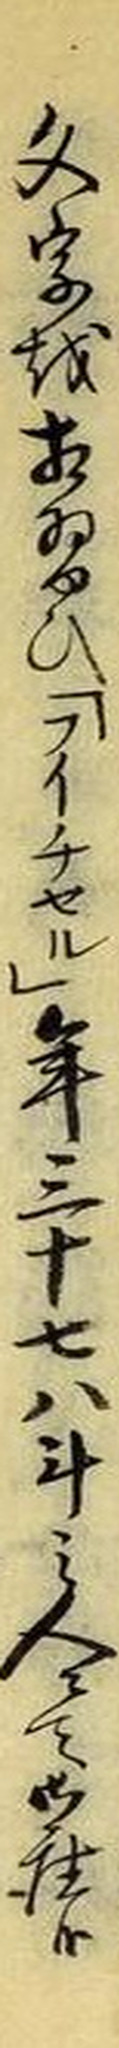文字を相習ひ「フイチセル」年三十七八計の人ニて御座候
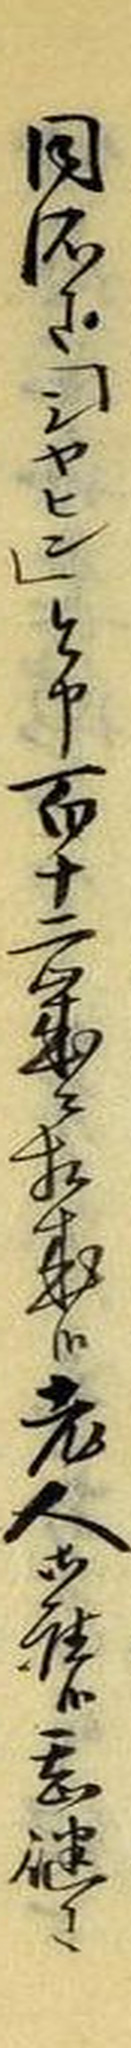同所に「シヤヒン」と申百十二歳ニ相成候老人御座候甚継に
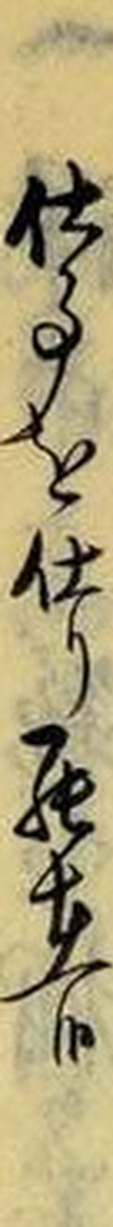仕事を仕り罷在候
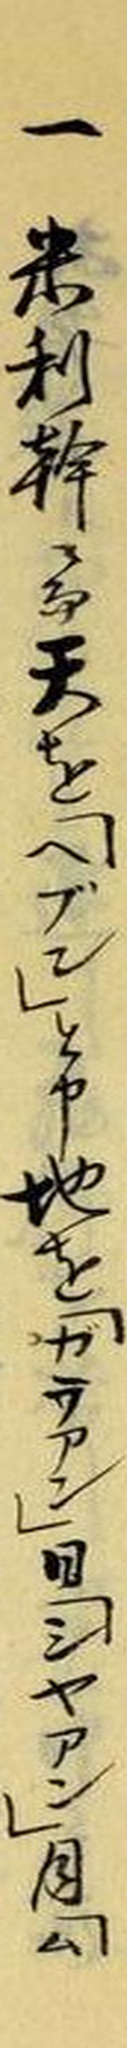一米利幹ニ而天を「へブン」と申地を「ガラアン」日「シヤアン」月「ム
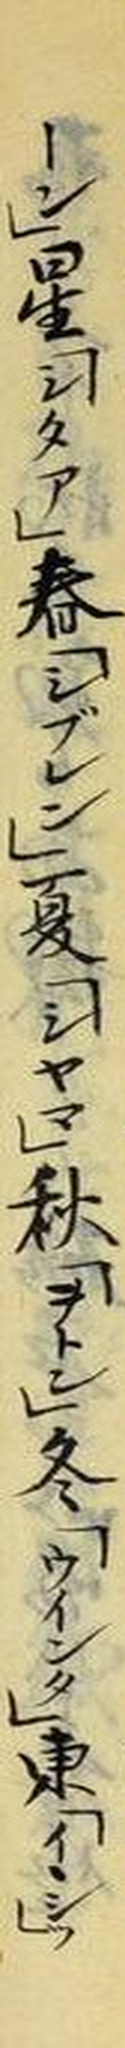ーン」星「シタア」春「シブレン」夏「シヤマ」秋「ヲトン」冬「ウインタ」東「イヽシツ」
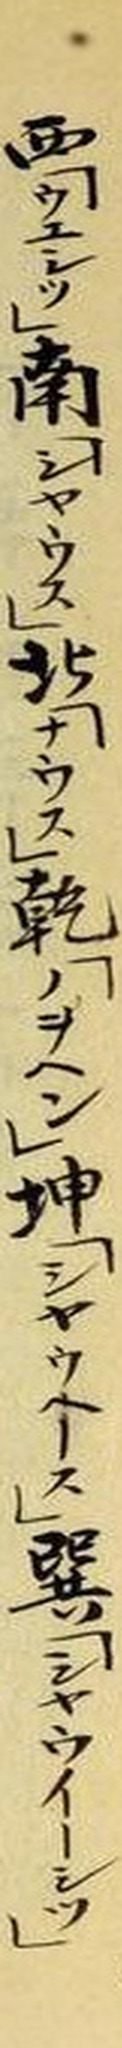西「ウエシツ」南「シヤウス」北「ナウス」乾「ノヲヘン」坤「シヤウへース」巽「シヤウイーシツ」
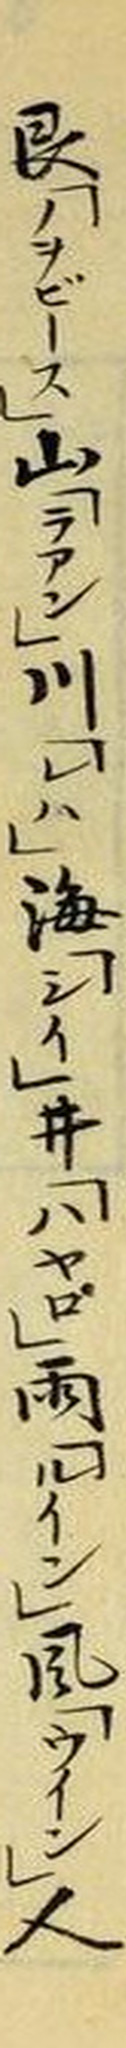艮「ノヲビース」山「ラアン」川「レハ」海「シイ」井「ハヤロ」雨「ルイン」風「ウイン」人
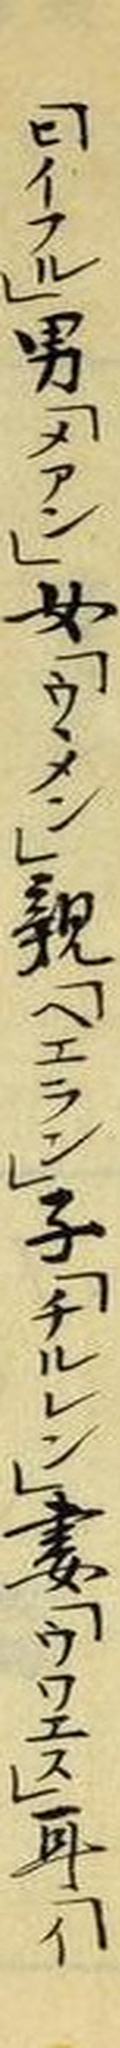「ヒイフル」男「メアン」女「ウヽメン」親「へエラン」子「チルレン」妻「ウワエス」耳「イ
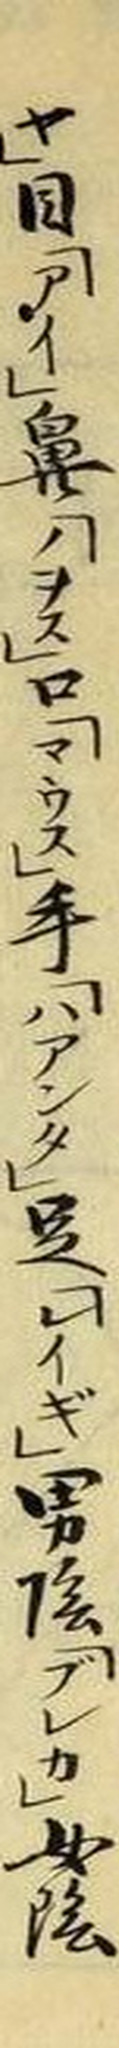ヤ」目「アイ」鼻「ノヲス」口「マウス」手「ハアンタ」足「レイギ」男陰「ブレカ」女陰
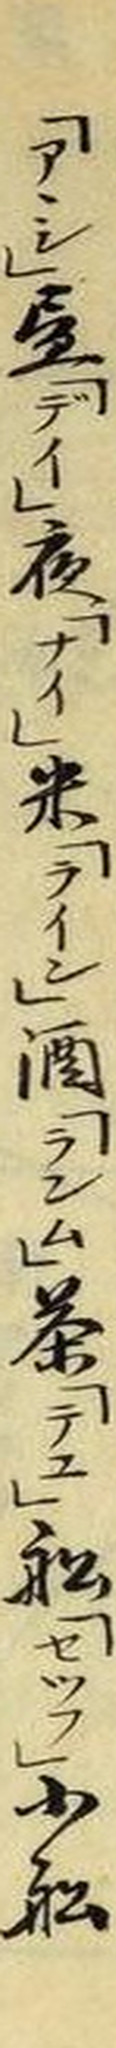「アヽシ」昼「デイ」夜「ナイ」米「ライン」酒「ランム」茶「テエ」船「セツフ」小船
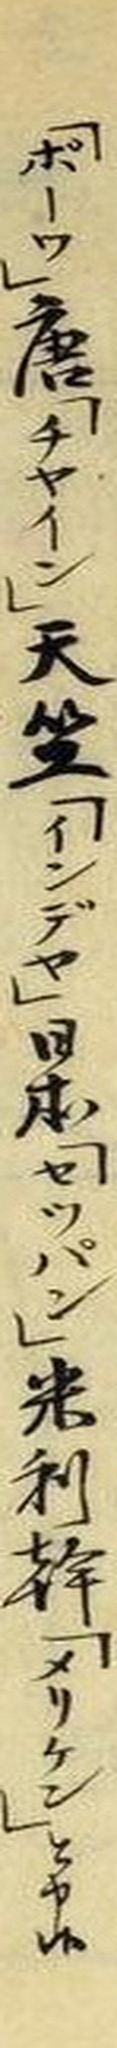「ポーワ」唐「チヤイン」天竺「インデヤ」日本「セツパン」米利幹「メリケン」と申候
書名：漂客談奇（備考雑録写8）
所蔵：福井県文書館 Fukui Prefectural Archives
